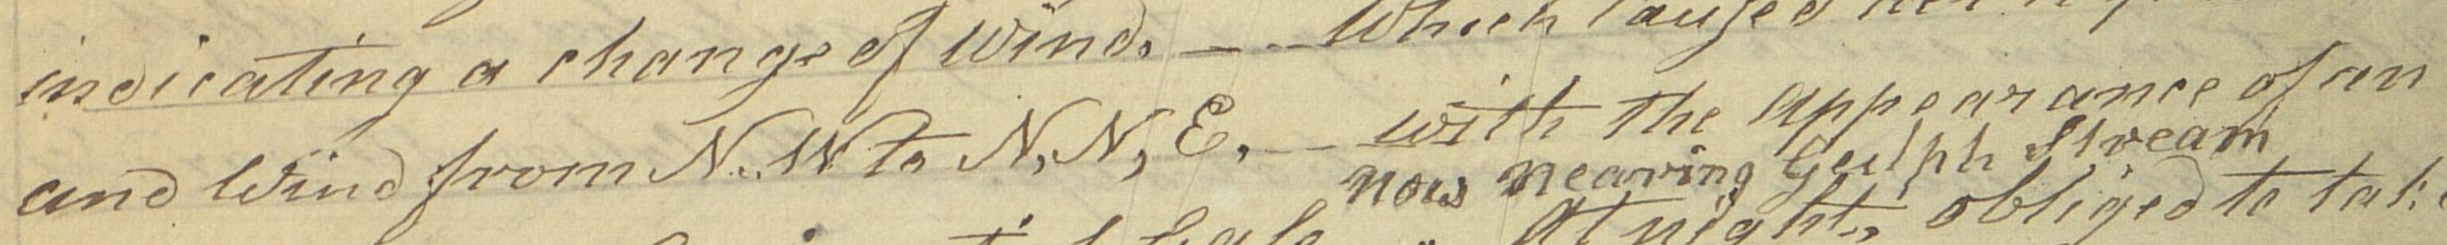and Wind from N.W to N.N.E. With the appearance of an
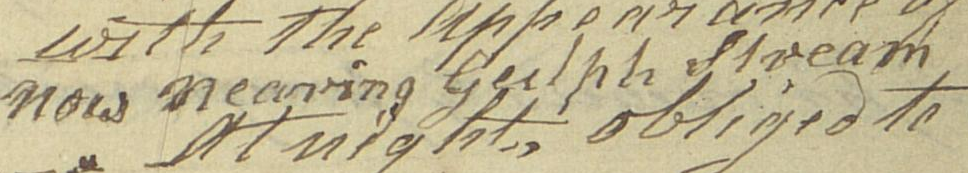Now nearing Gulph Stream
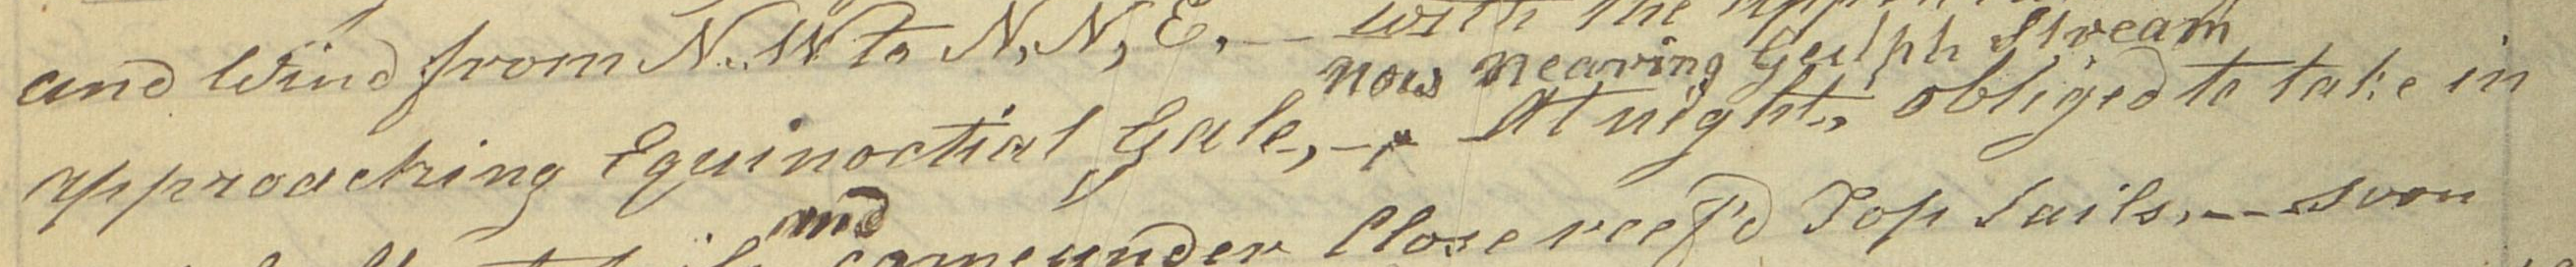approaching Equinoctial Gale, ^ At night, obliged to take in
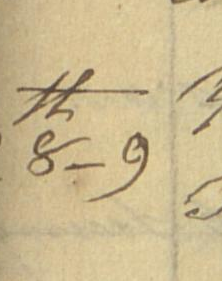^th 8-9
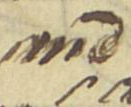and
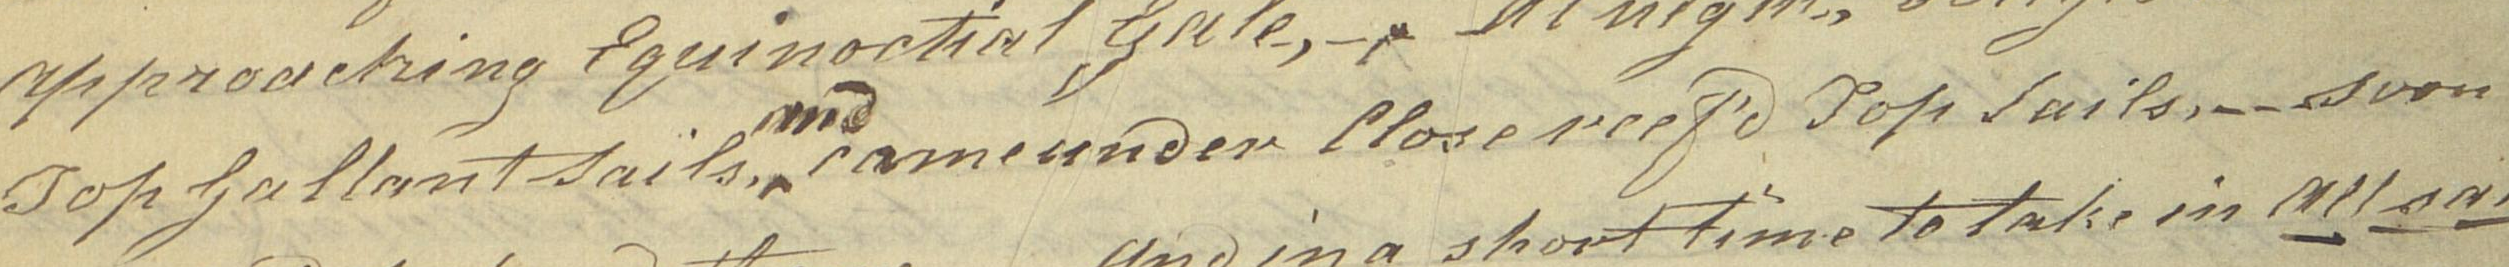Top Gallant Sails ^ came under Close reef'd Tops Sails. soon
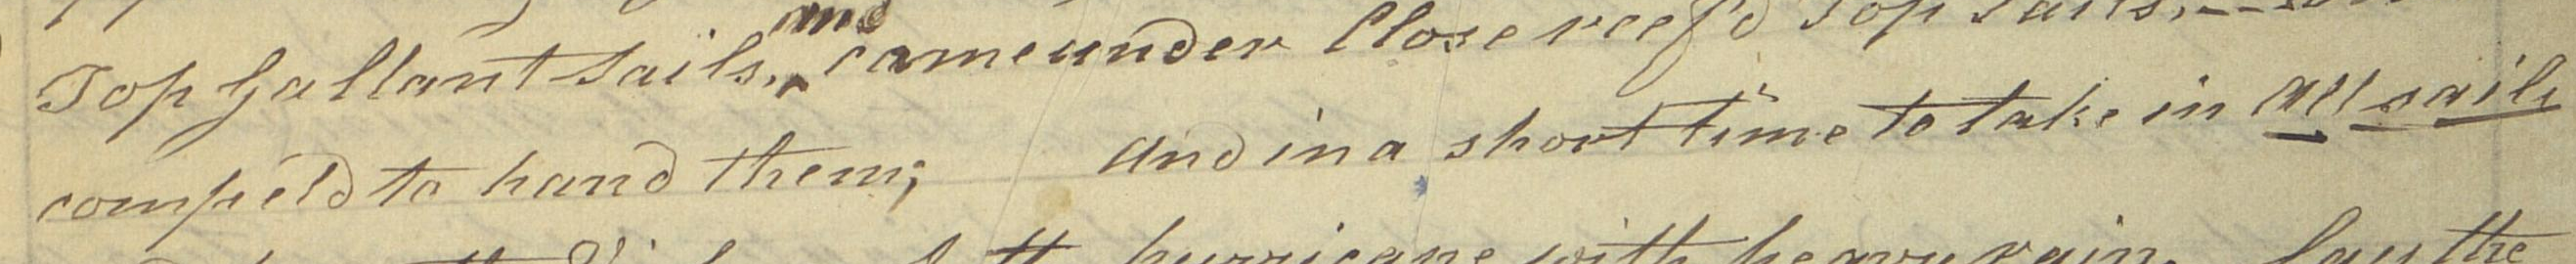compeld to hand them; And in a short time to take in All sails
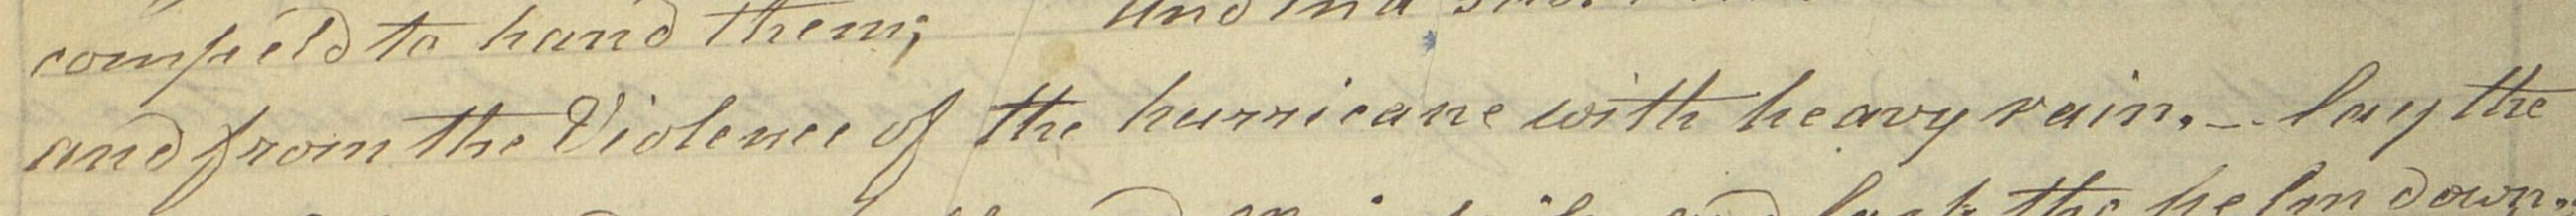and from the Violence of the hurricane with heavy rain, lay the
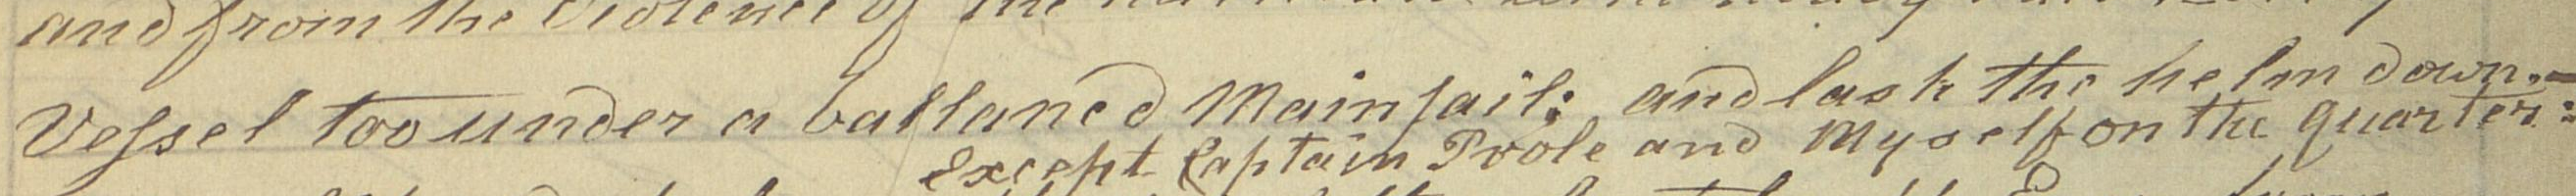Vessel too under a ballanced Main sail; and lash the helm down.
